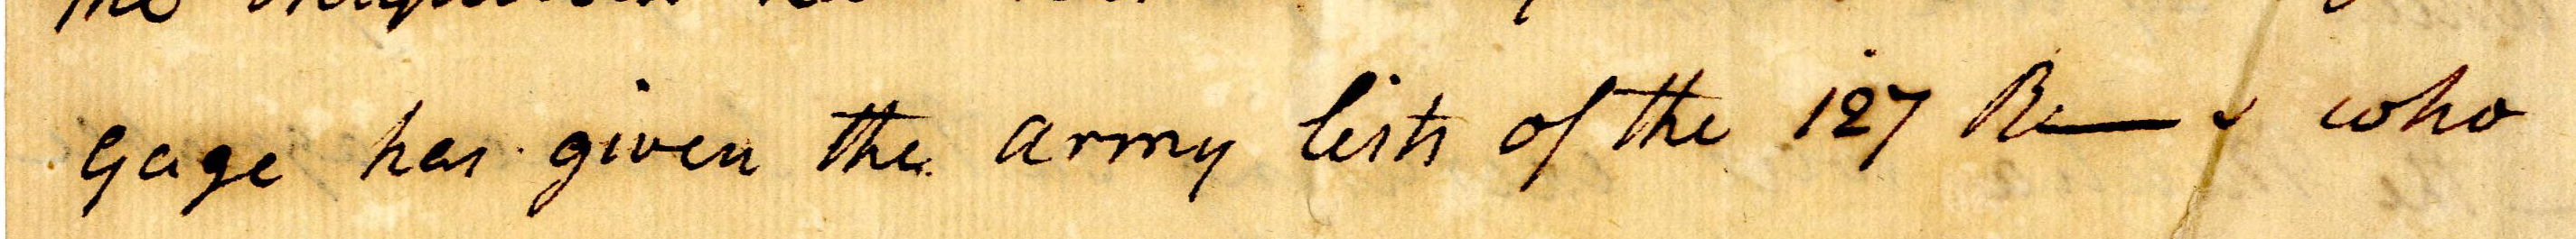Gage has given the army lists of the 127 R-s who
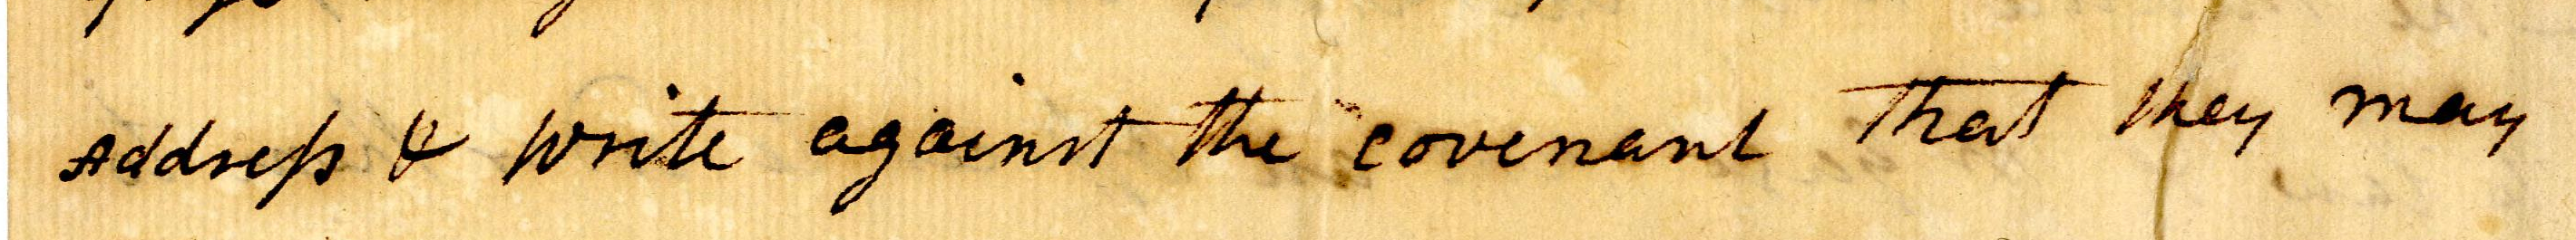Address & write against the covenant that they may
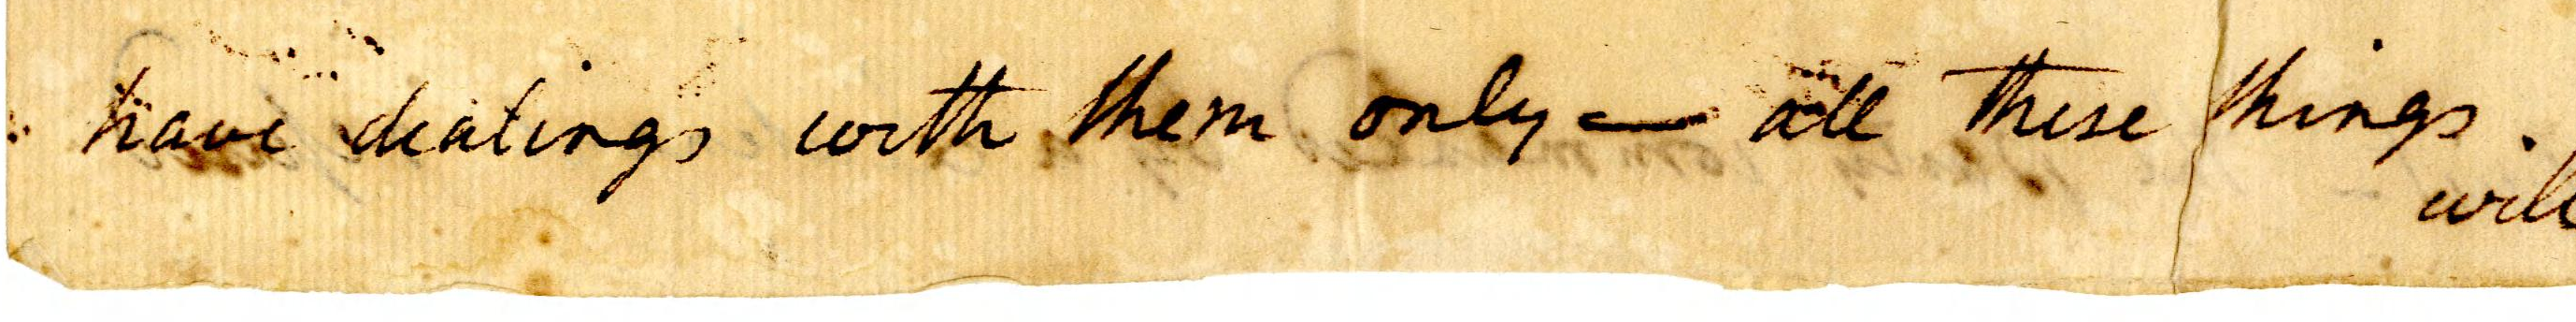have dealings with them only- all these things.
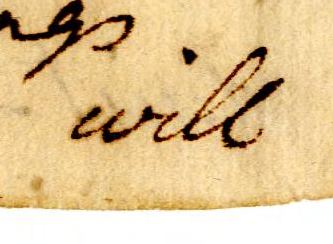will
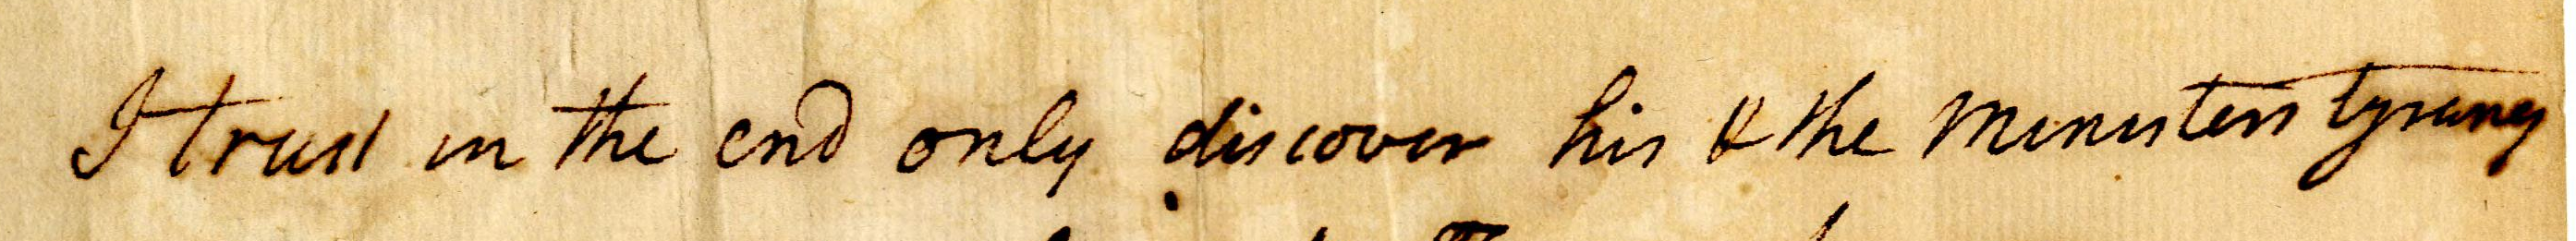I trust in the end only discover his & the Ministers tyrany
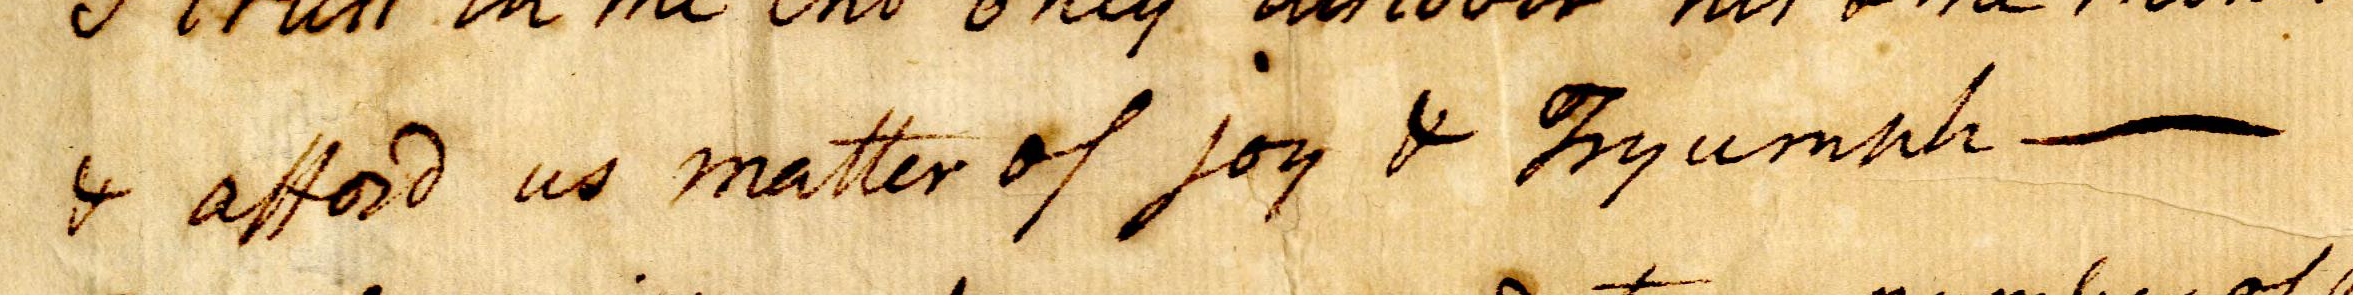& afford us matter of joy & Tryumph-
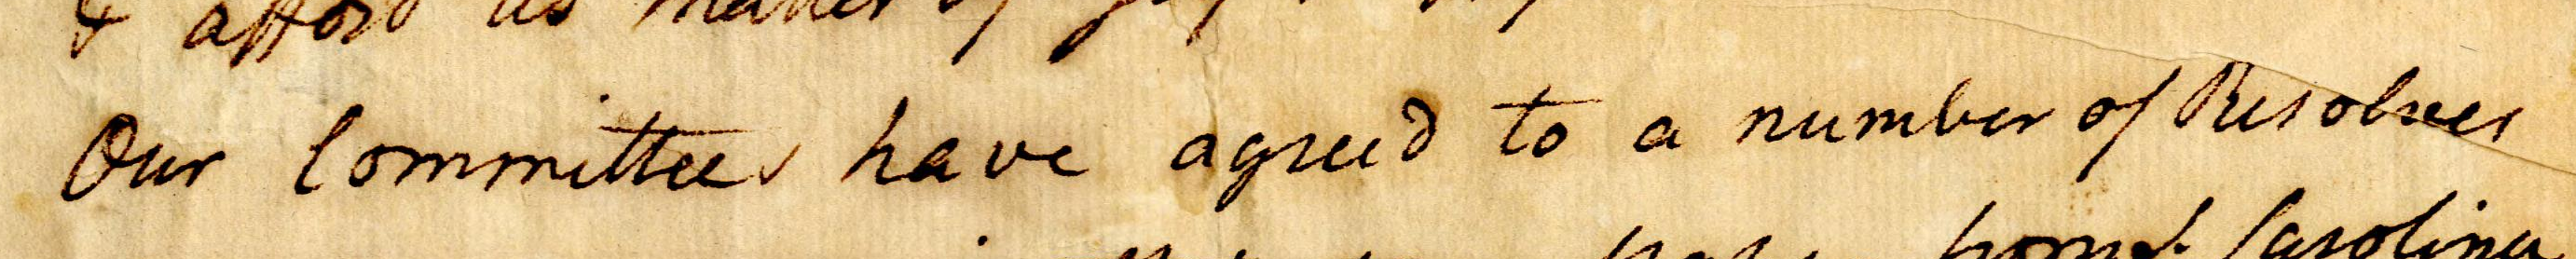Our Committees have agreed to a number of Resolves
